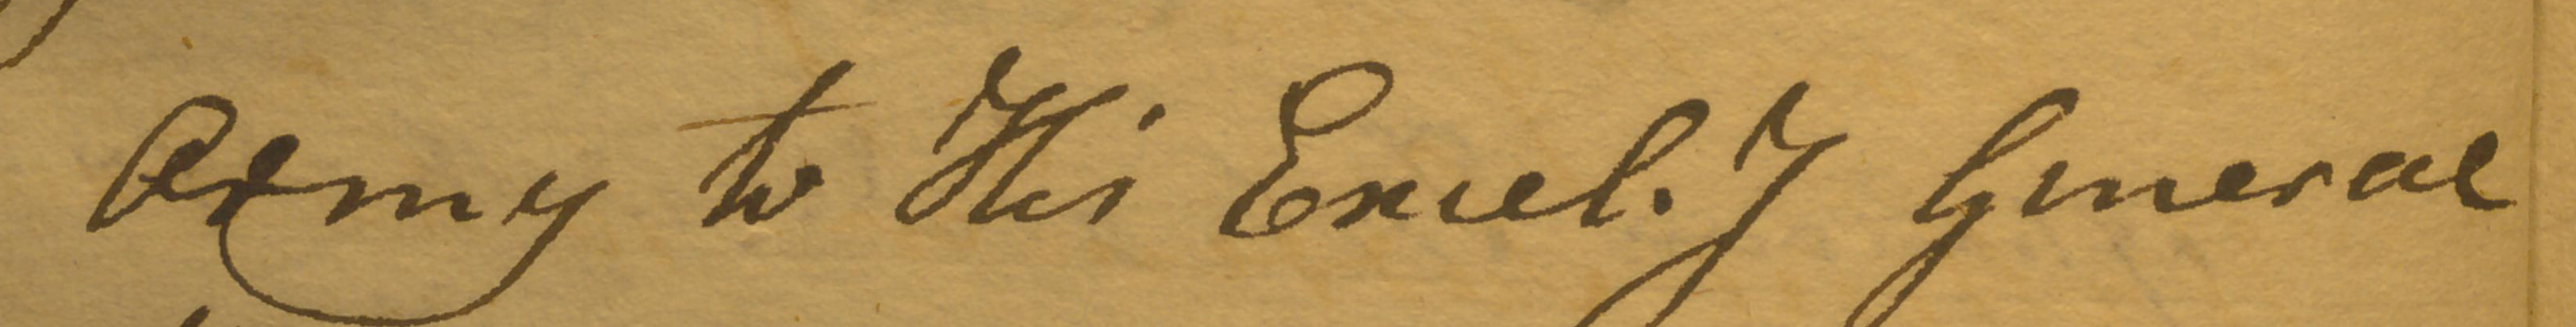Army to His Excel^y. General
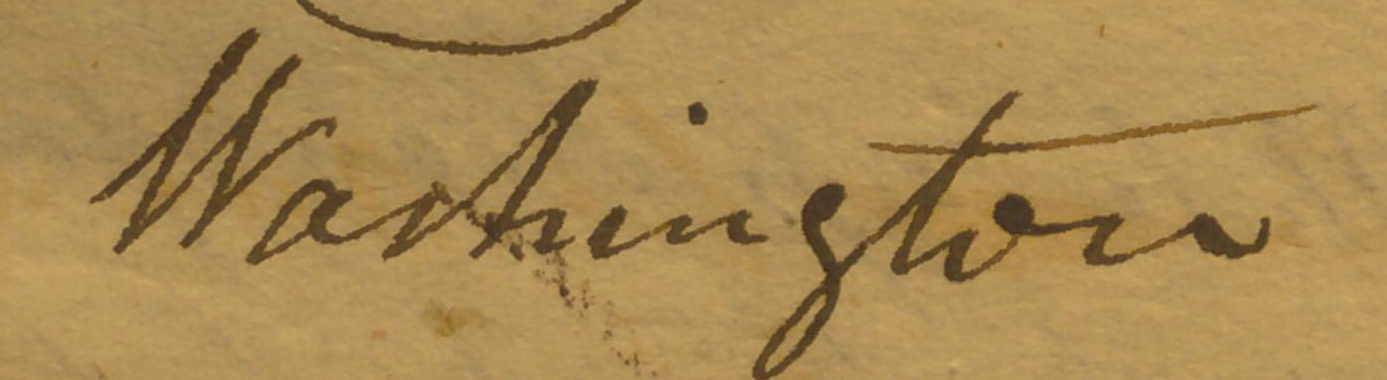Washington
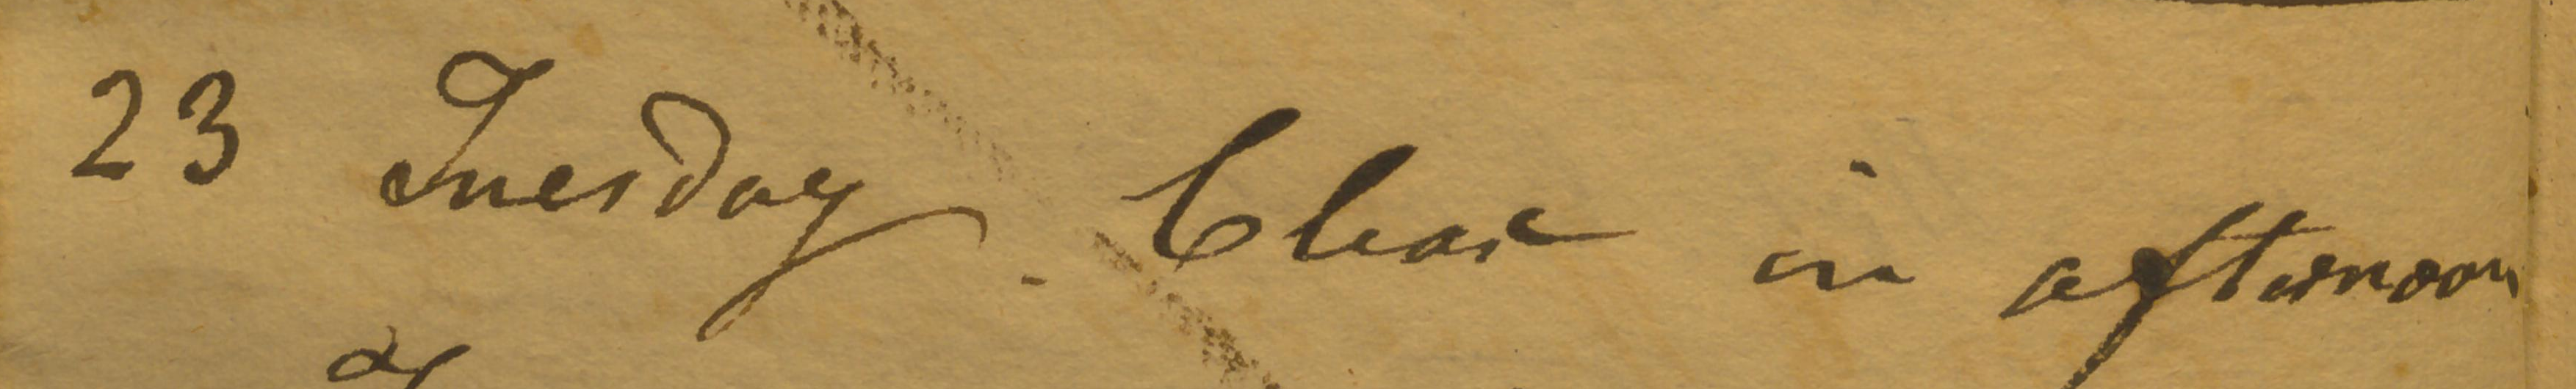23 Tuesday Clear in afternoon
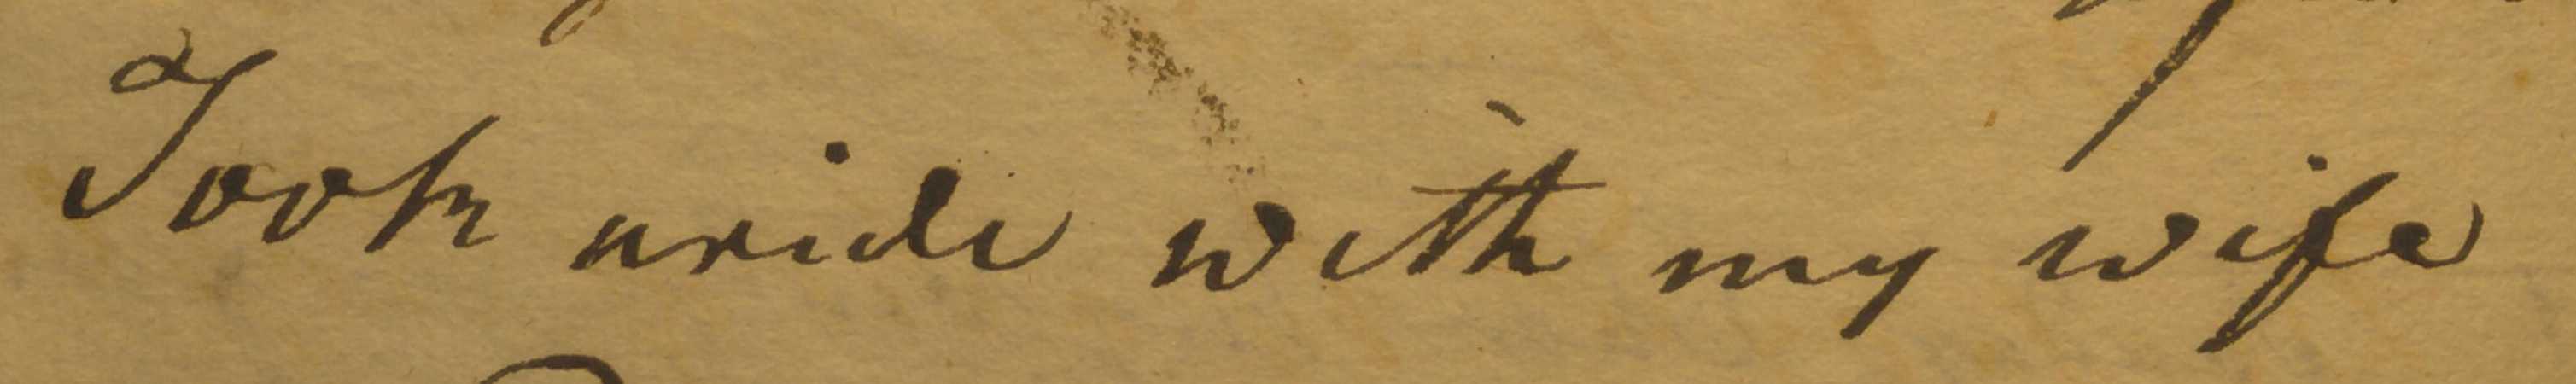Took a ride with my wife
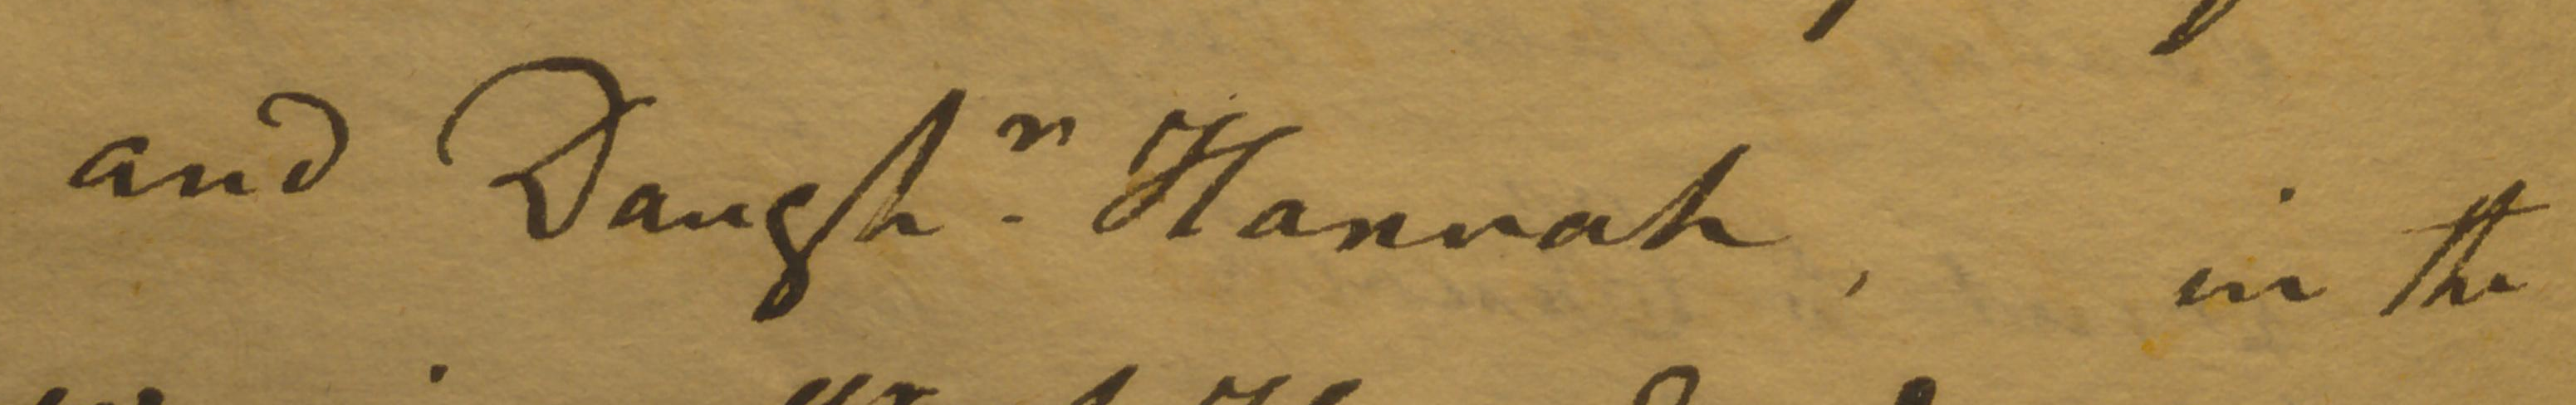and Daugh^r. Hannah, in the
